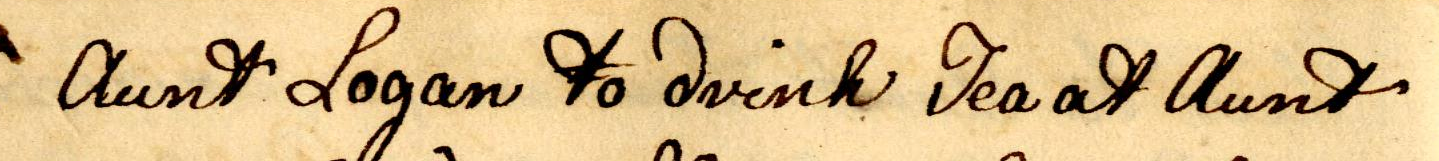Aunt Logan to drink Tea at Aunt
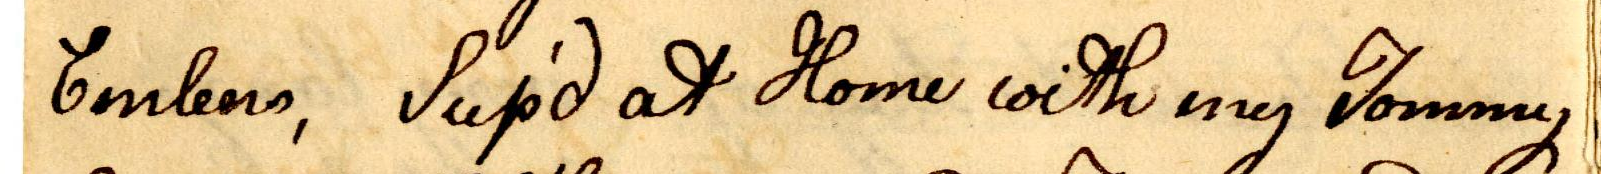Emlens, Sup'd at Home with my Tommy
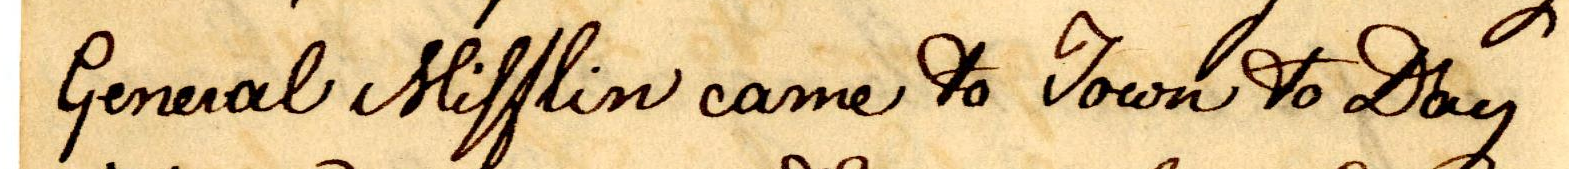General Mifflin came to Town to Day
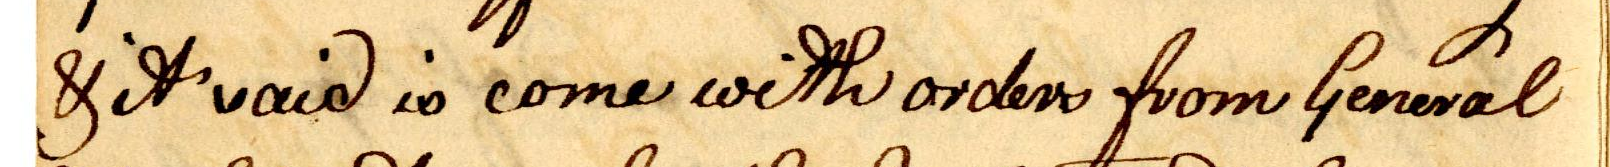& it said is come with orders from General
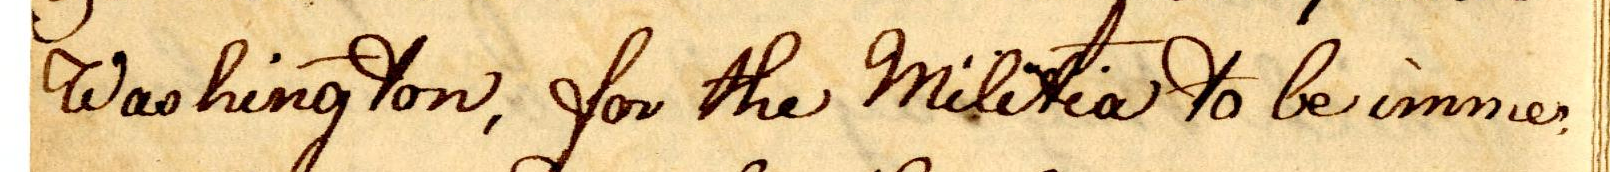Washington, for the Militia to imme-
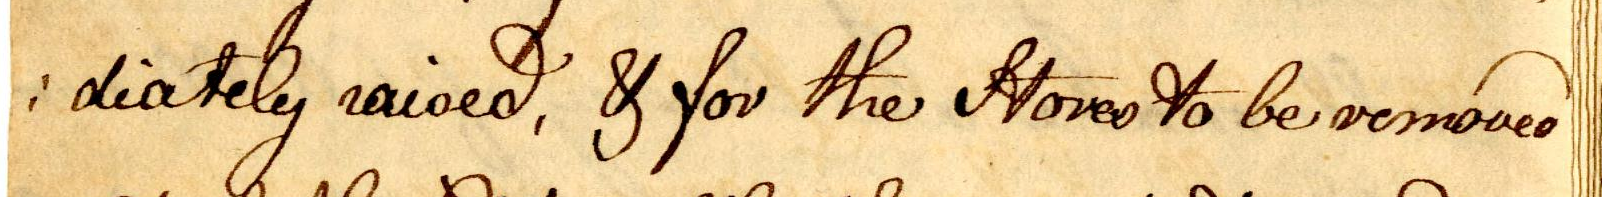-diately raised, & for the Stores to be removed
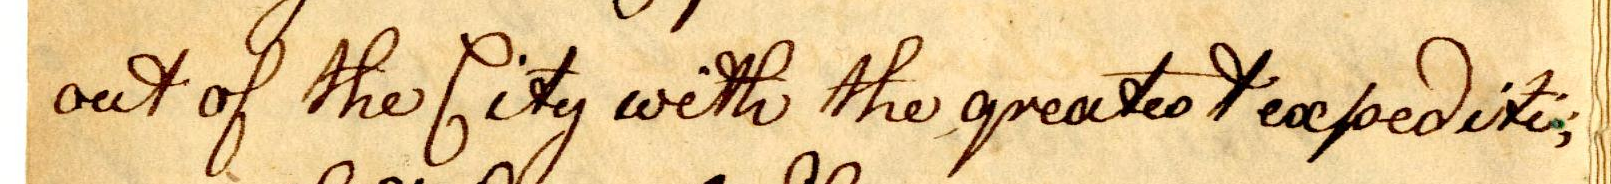out of the City with the greatest expediti-
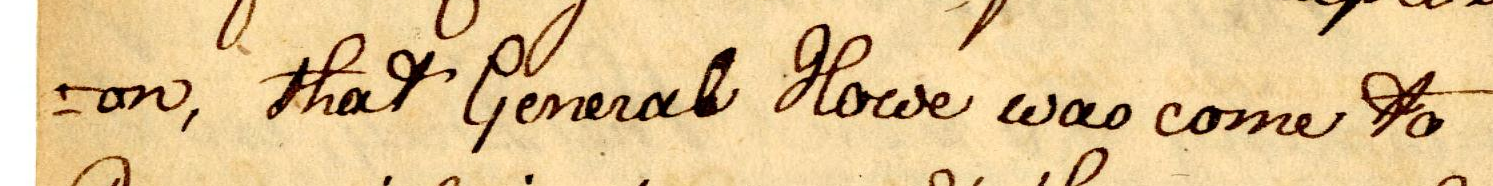-on, that General Howe was come to
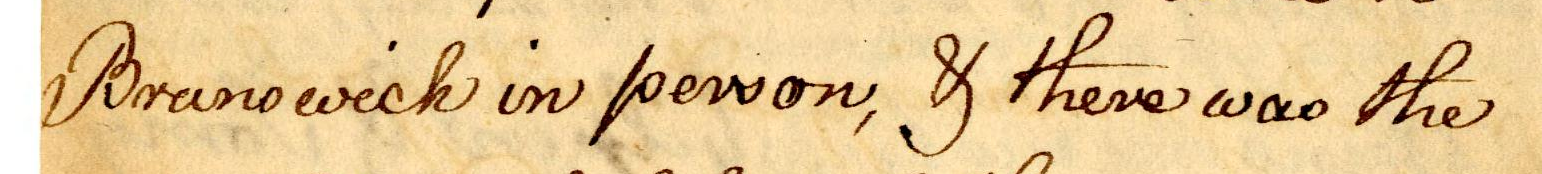Brunswick in person, & there was the
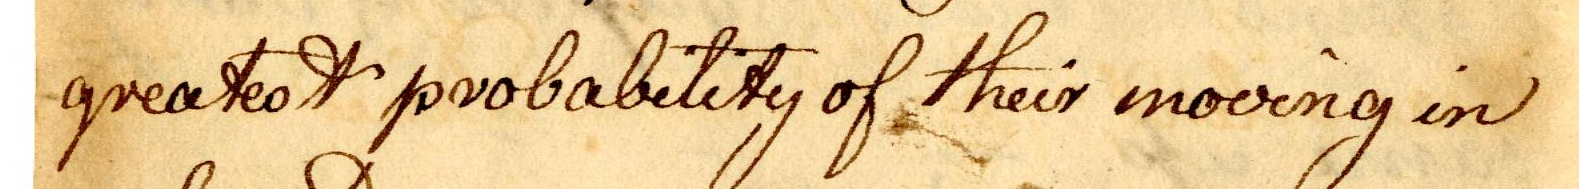greatest probability of their moving in
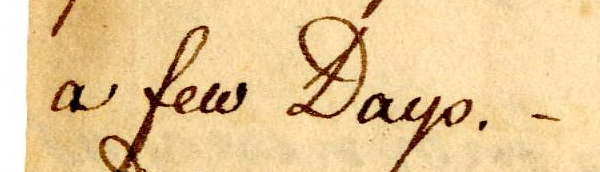a few Days.-
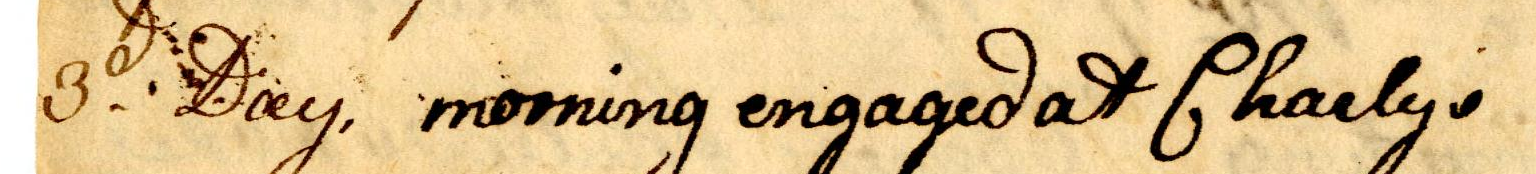3^d Day, morning engaged at Charlys
